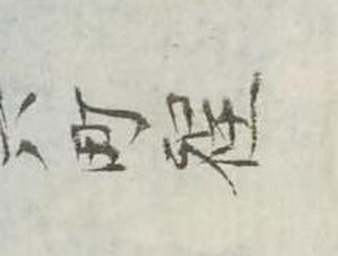壹町程
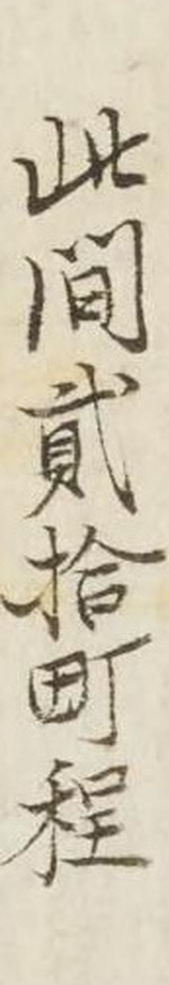此間貮拾町程
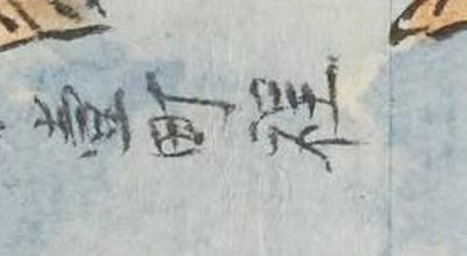壹町程
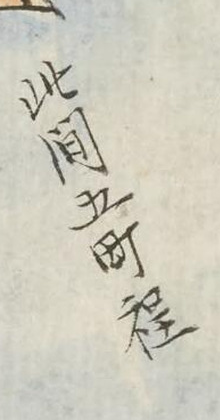此間五町程
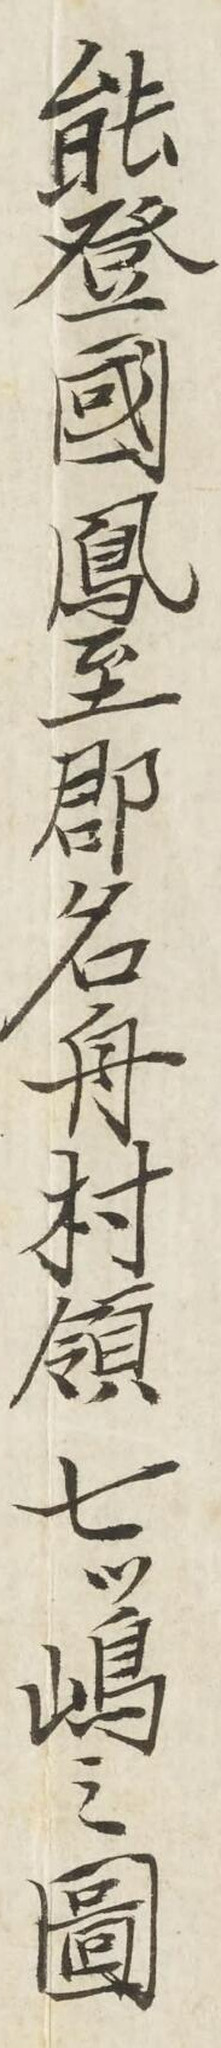能登國鳳至郡名舟村領七ツ嶋之圖
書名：能登国鳳至郡七ツ嶋図
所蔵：Ishikawa Prefectural Library
